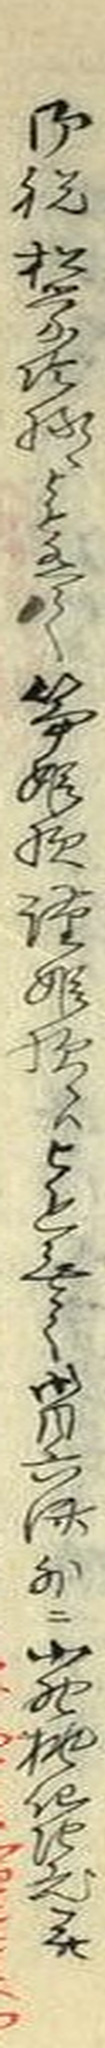御祝松栄院様へ被進有之箏姫様謹姫様へハ被進無之御目六済外ニ小野桃仙院老幷
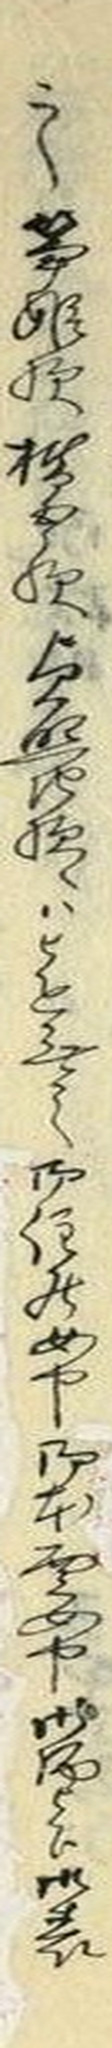之箏姫様楷五郎様貞照院様ヘハ被進無之御住居女中御本殿之方女中御酒被下御表
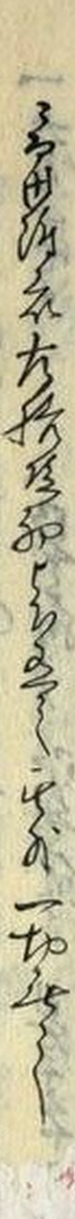ニ而御附衆左膳殿初被下有之其外一切無之
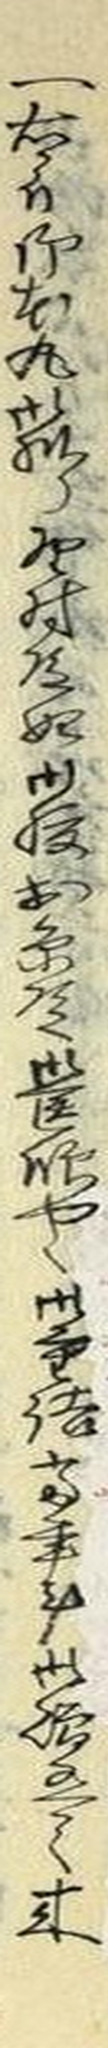一右ニ付御本丸御掛り野村殿始御腹お糸殿御医師中へ御重詰当年斗御贈有之来
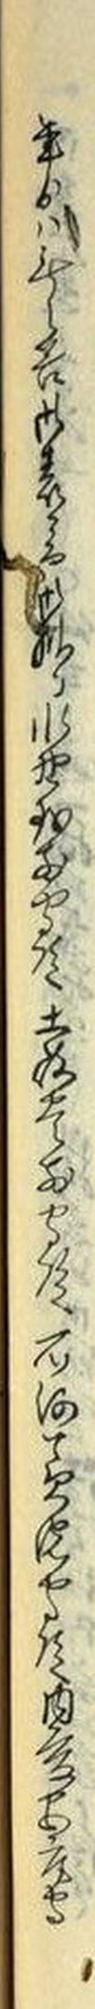年ゟハ無之筈御表ニ而御掛り水野越前守殿土岐豊前守殿石河美濃守殿内藤安房守
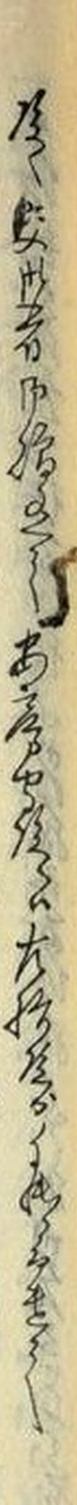殿へ交御肴御贈有之安房守殿ヘハ左膳殿ゟ手紙ニ而遣之
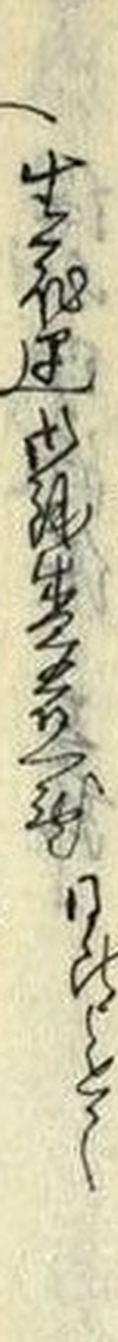謹姫様ゟ御鉢盛鮓一台同断被進之
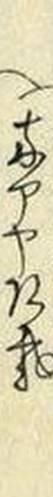両部屋頂戴
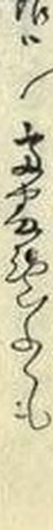両番台子へも
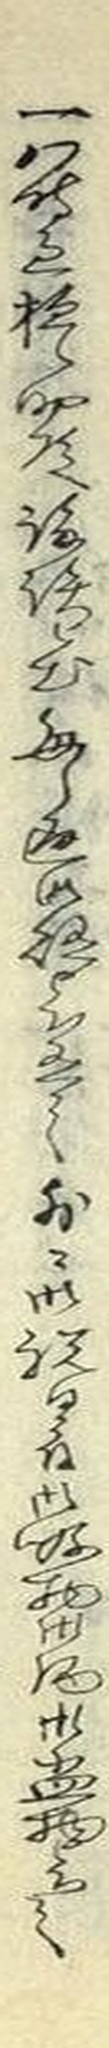一八時過桓之助殿講談被出毎之通御賄被下有之外ニ御祝日ニ付御吸物御酒御小皿物被下之
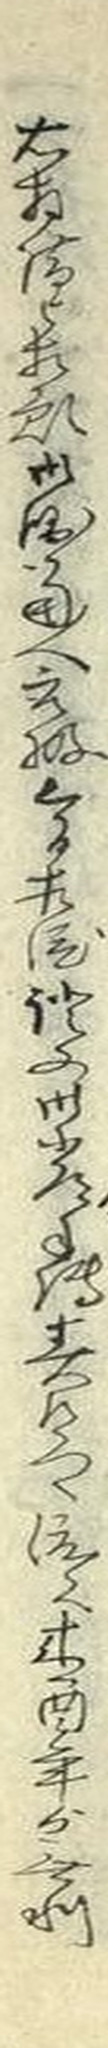右拝借被相願御側御用人取扱今日相渡証文御小道具手伝春左衛門へ渡ス来酉年ゟ無利
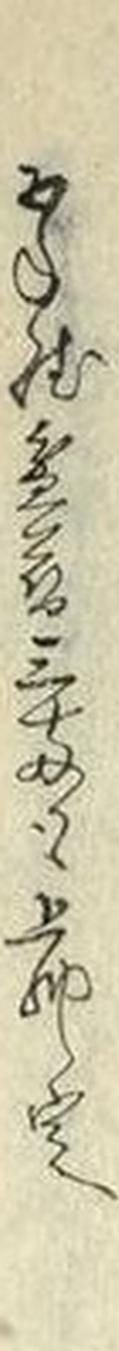五年賦盆暮三両ツヽ上納之定

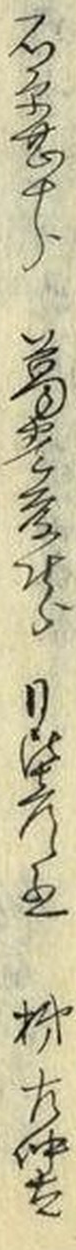石原甚十郎葛巻藤次郎日比彦之丞梯左仲太
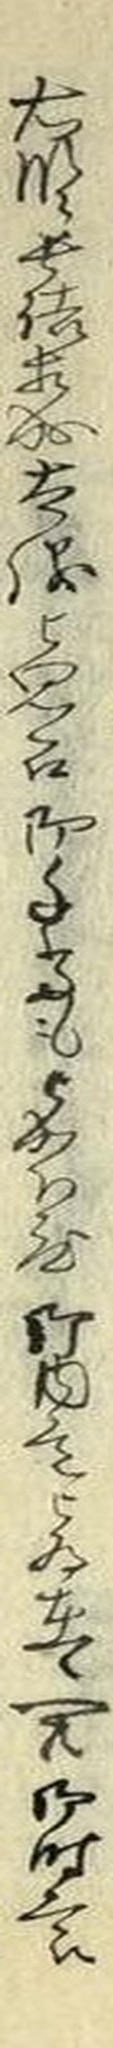右段々長詰相成太儀被思召御手当も被成下度御内意被為在候へ共御時節
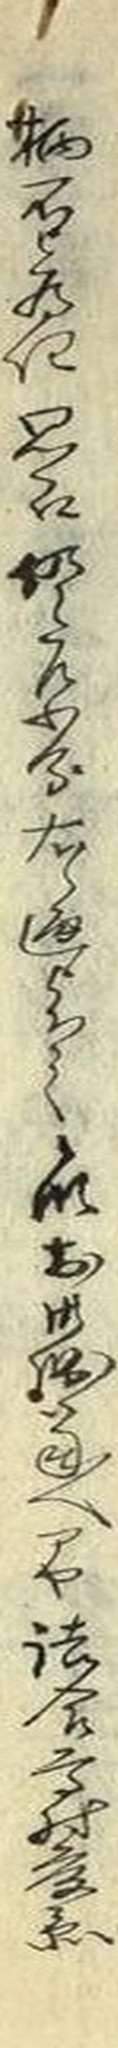柄不被為任思召依之乍小分右之通被下之候段於側御用人部屋詰合高村藤兵衛
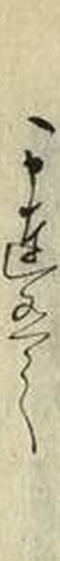へ申達有之
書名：少傅日録抄（斉善付側向頭取日記、在府）
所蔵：福井県文書館 Fukui Prefectural Archives
